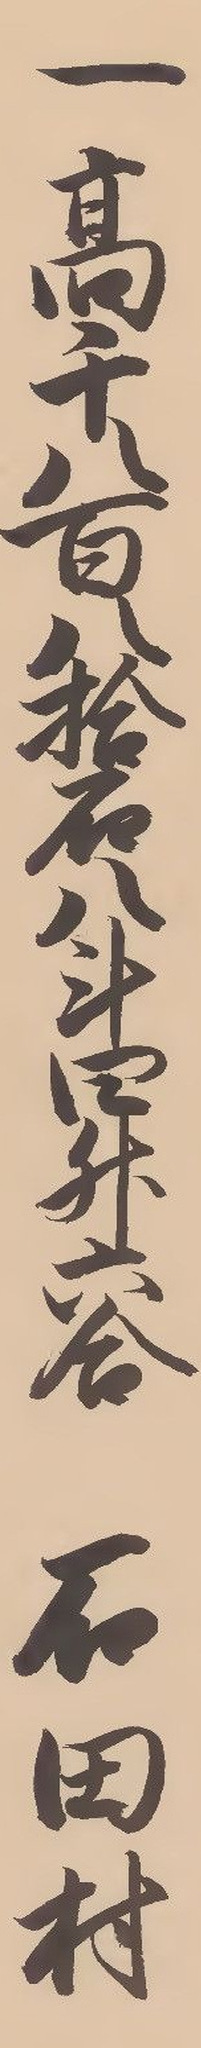一高千八百八拾石八斗四升六合石田村
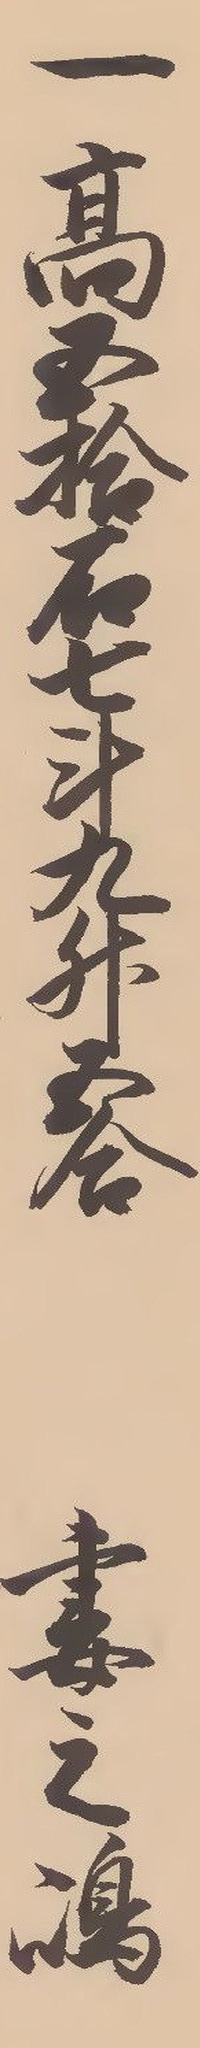一高五拾石七斗九升五合妻之島
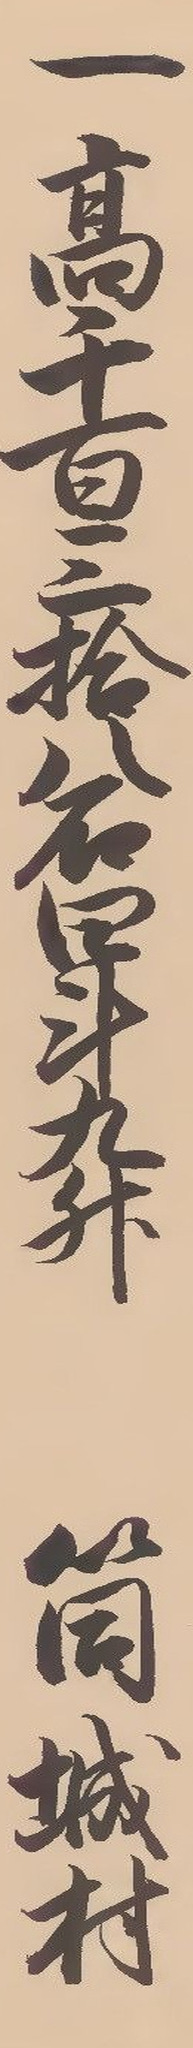一高千百三拾八石四斗九升筒城村
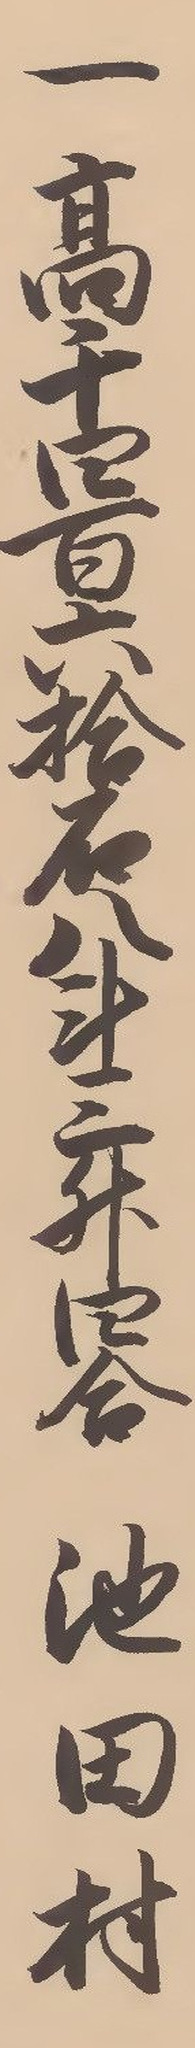一高千四百六拾石八斗三升四合池田村
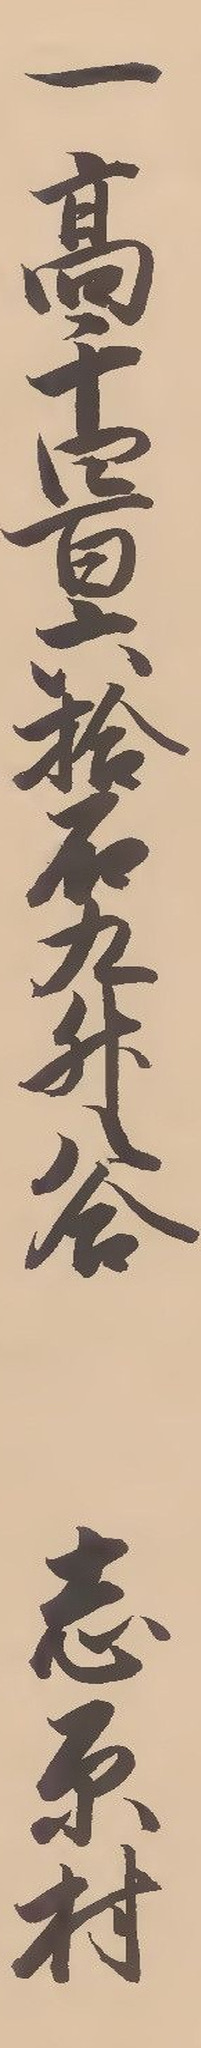一高千四百六拾石九升八合志原村

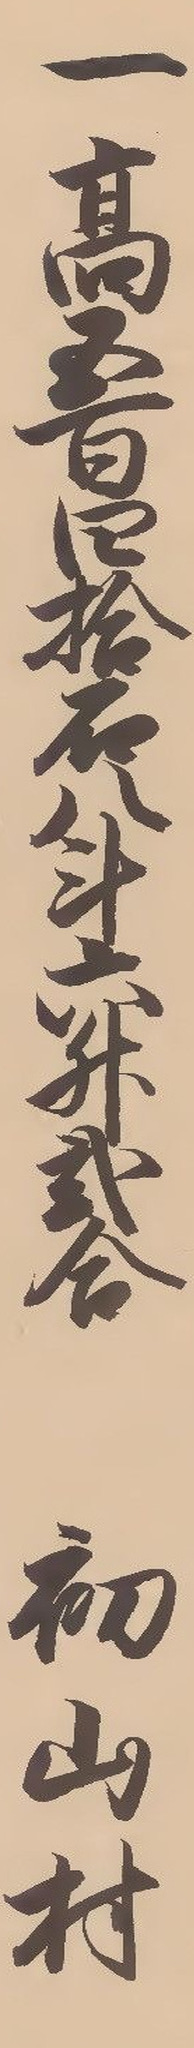一高五百四拾石八斗六升弐合初山村
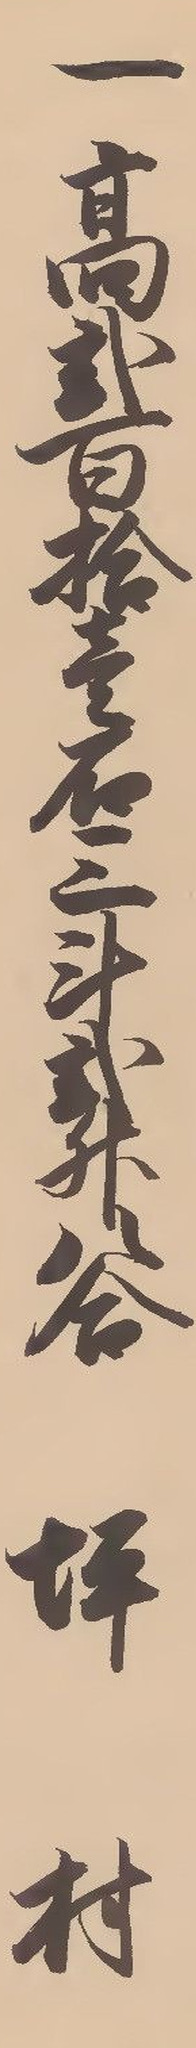一高弐百拾壱石三斗弐升八合坪村
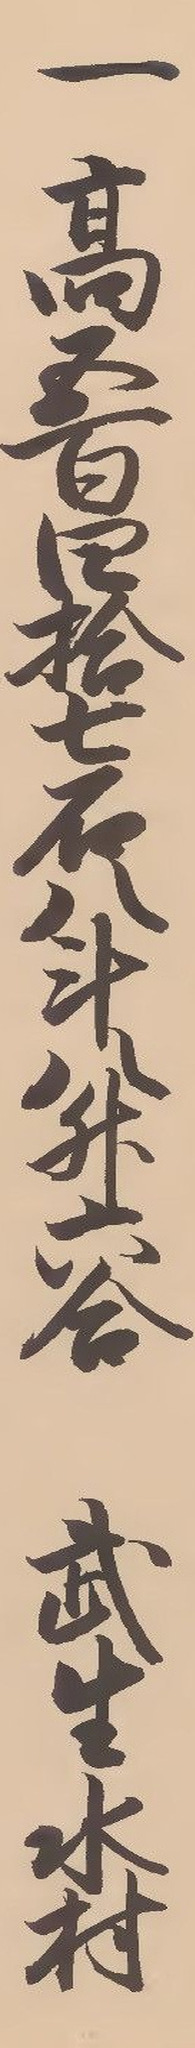一高五百四拾七石八斗八升六合武生水村
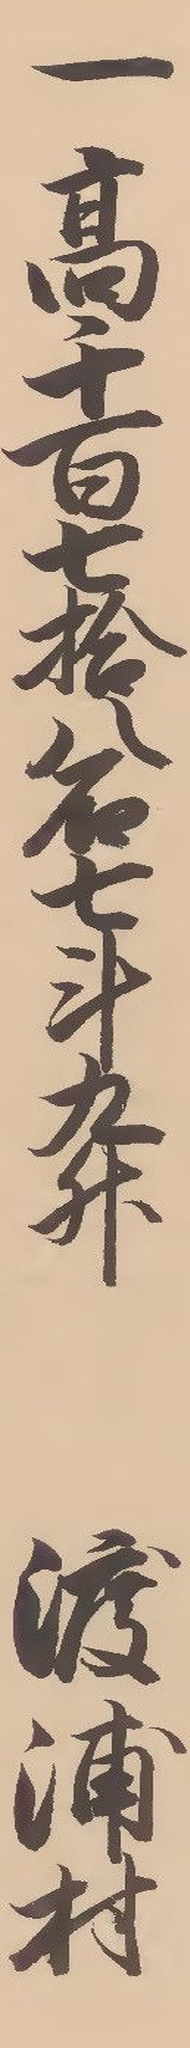一高千百七拾八石七斗九升渡浦村

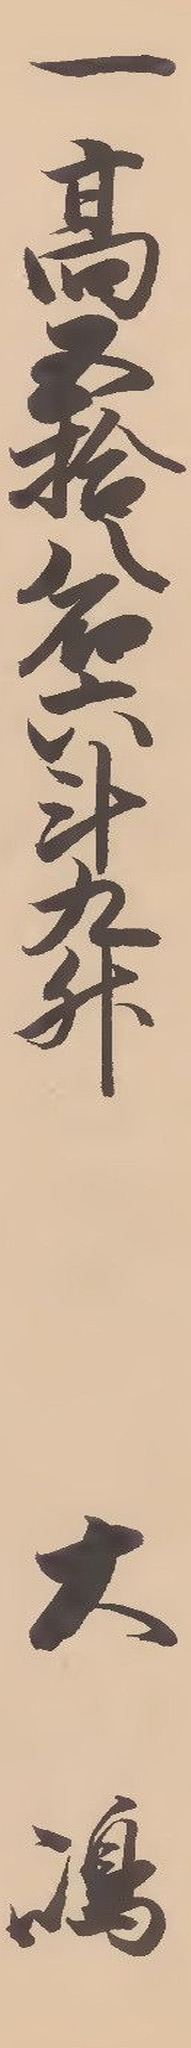一高五拾八石六斗九升大島
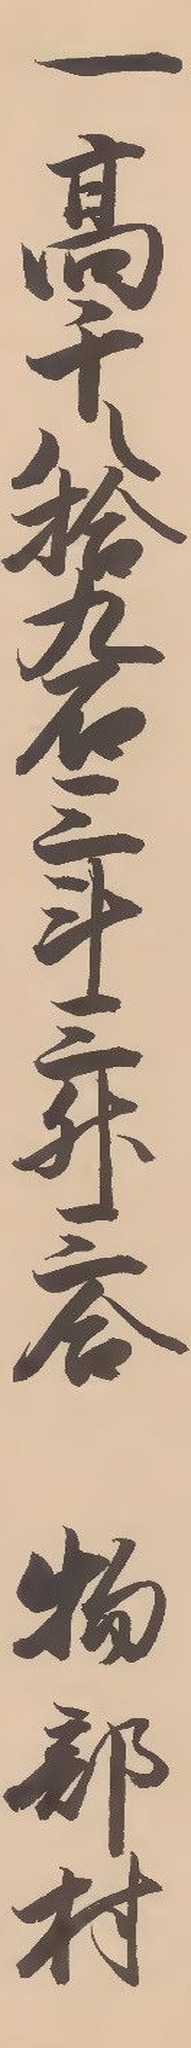一高千八拾九石三斗三升三合物部村
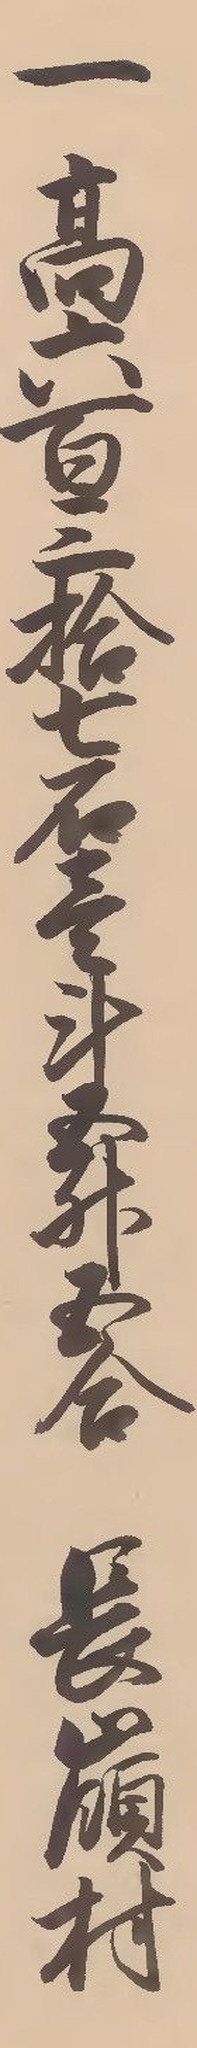一高六百三拾七石壱斗五升五合長峰村

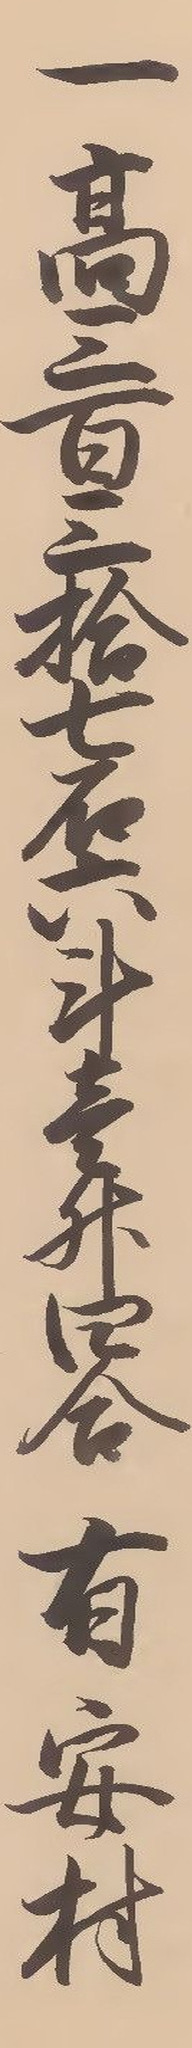一高三百三拾七石六斗壱升四合有安村
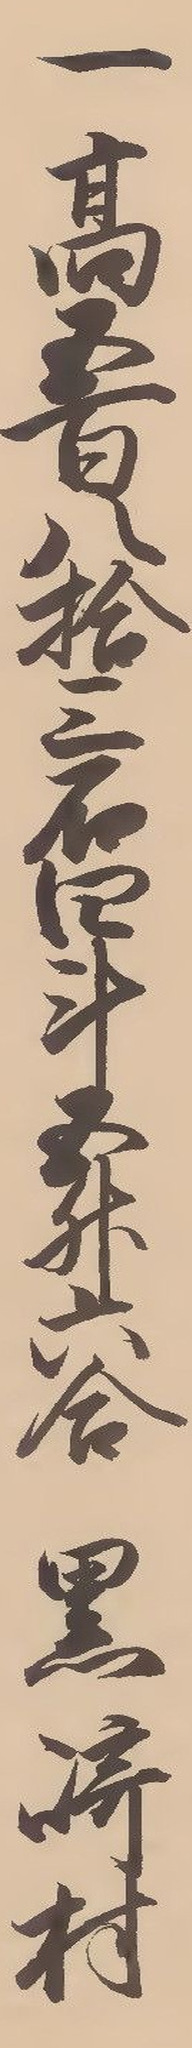一高五百八拾三石四斗五升六合黒崎村
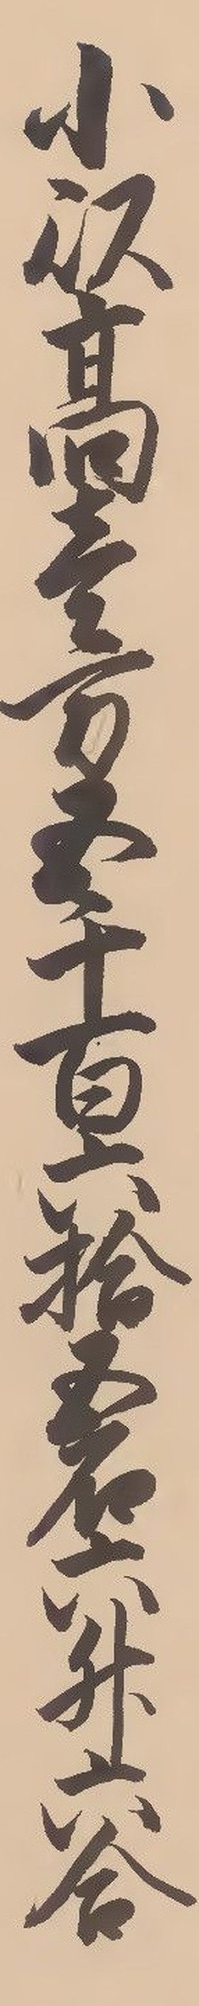小以高壱万五千百六拾五石六升六合
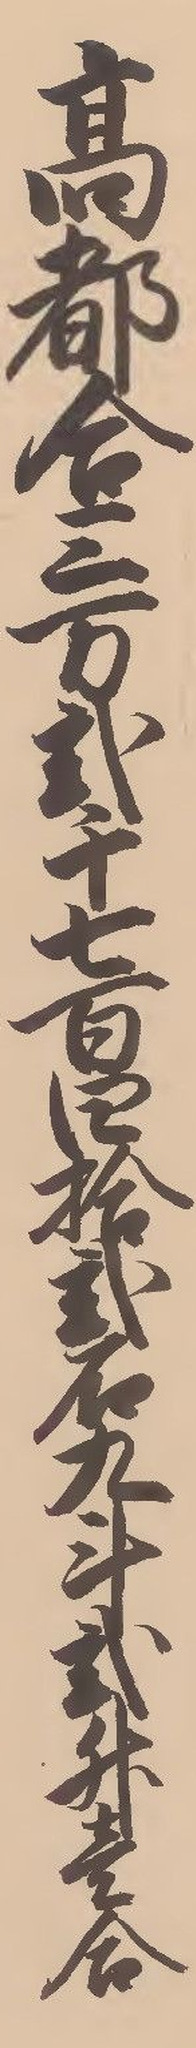高都合三万弐千七百四拾弐石九斗弐升壱合
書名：壱岐国郷帳
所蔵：国立公文書館 National Archives of Japan
